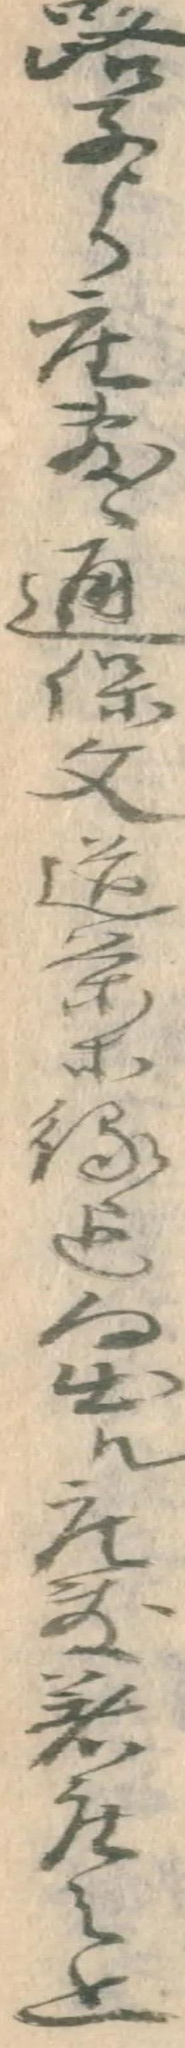路前より座敷ヘ通保文道参等縁迄向出ル座敷着座之上

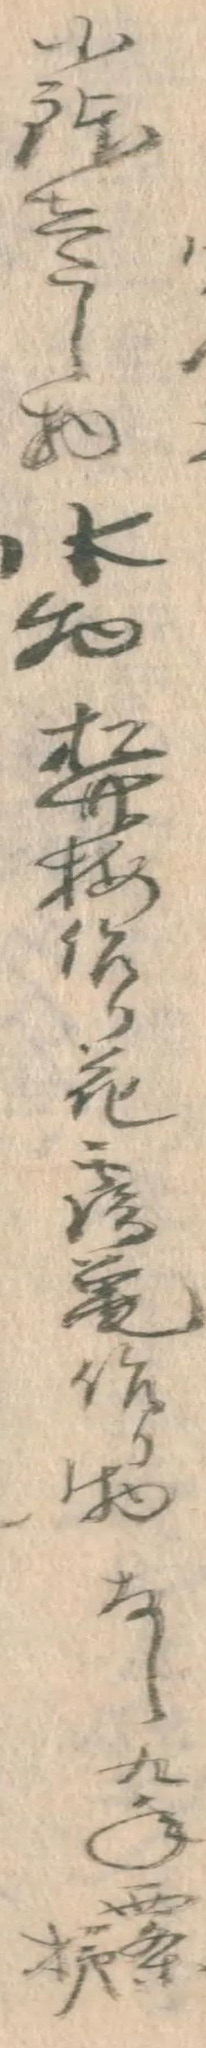小鉢ひたし物水物松竹梅作り花覆亀作り物なし九年西條梯
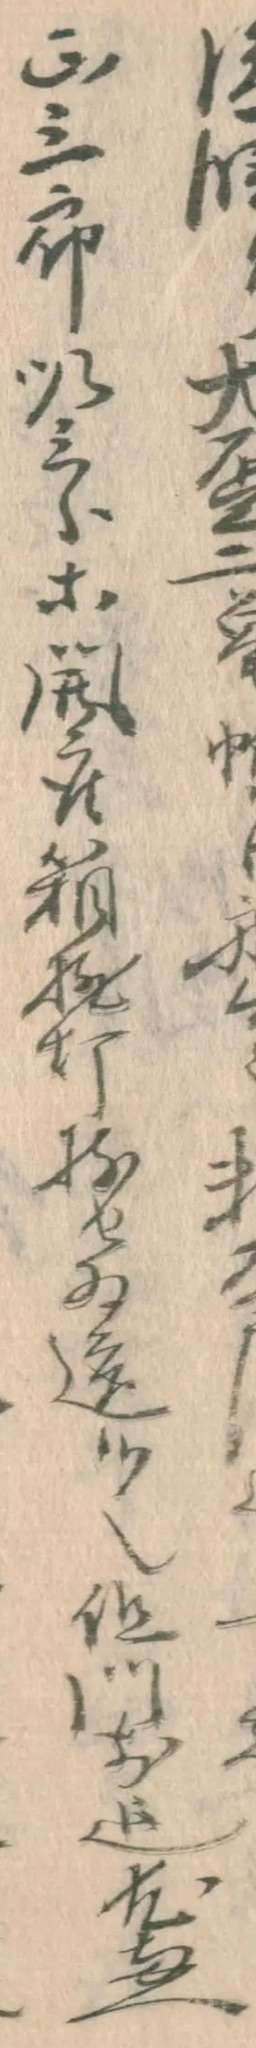正三郎順三郎等開座箱桃灯持セ為送候之但門前迄尤両人
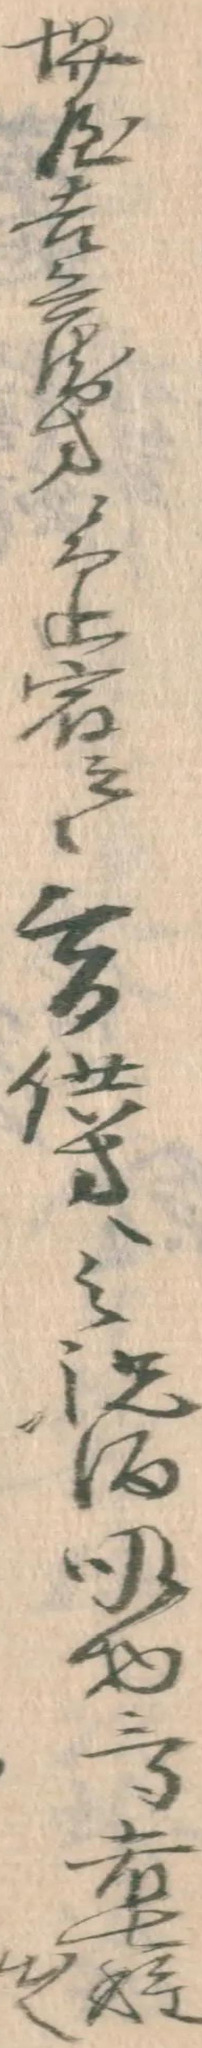堺屋吉兵衛方ニ而止宿云々今日供方へ之祝酒吸物三ツ肴七種出也
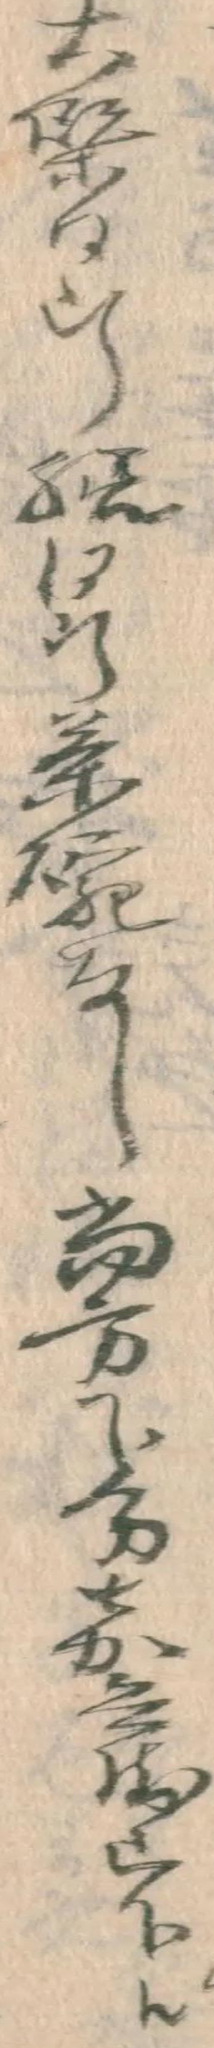大概同断了膳同断茶碗なし當方下分嘉兵衛已下え
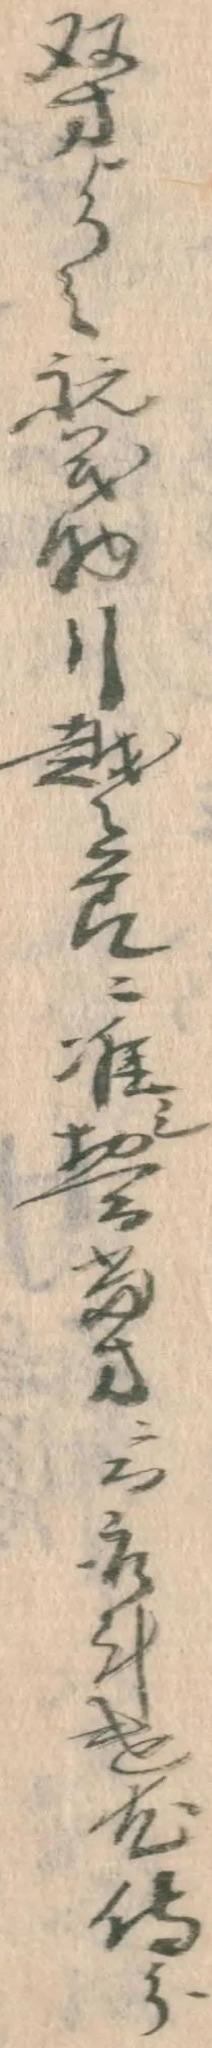双方より之祝義物引越之節に准シ惣而當方ニ而取斗遣尤侍分
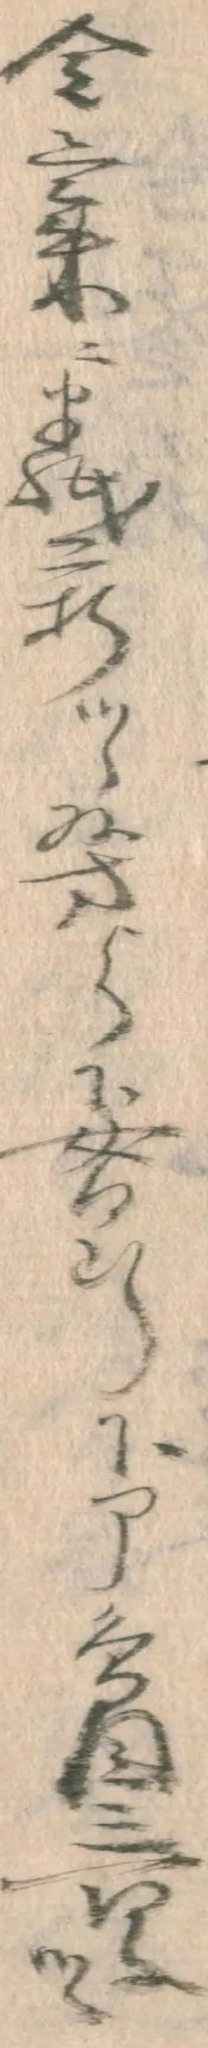金弐朱ニ半紙二折ツヽ双方より下女同断下部魚目三四文ツヽ
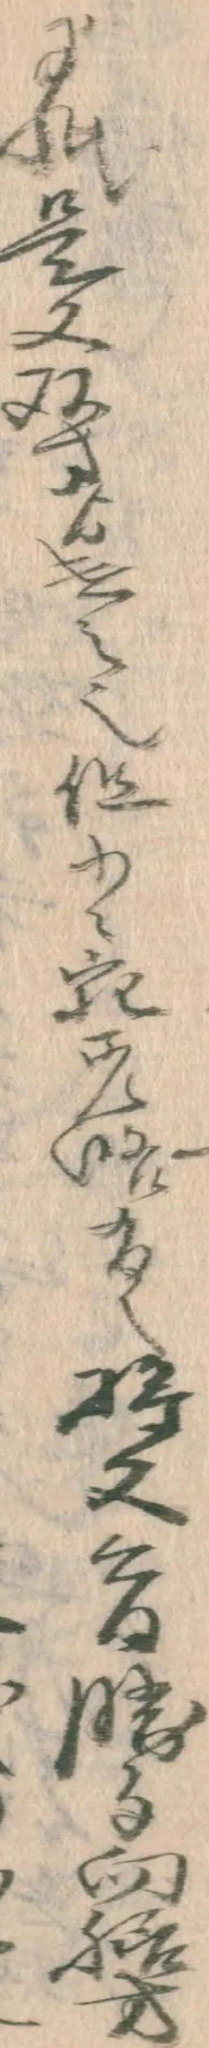半紙是又双方ゟ遣之也但少々宛差略有之将又今日勝手向膳方
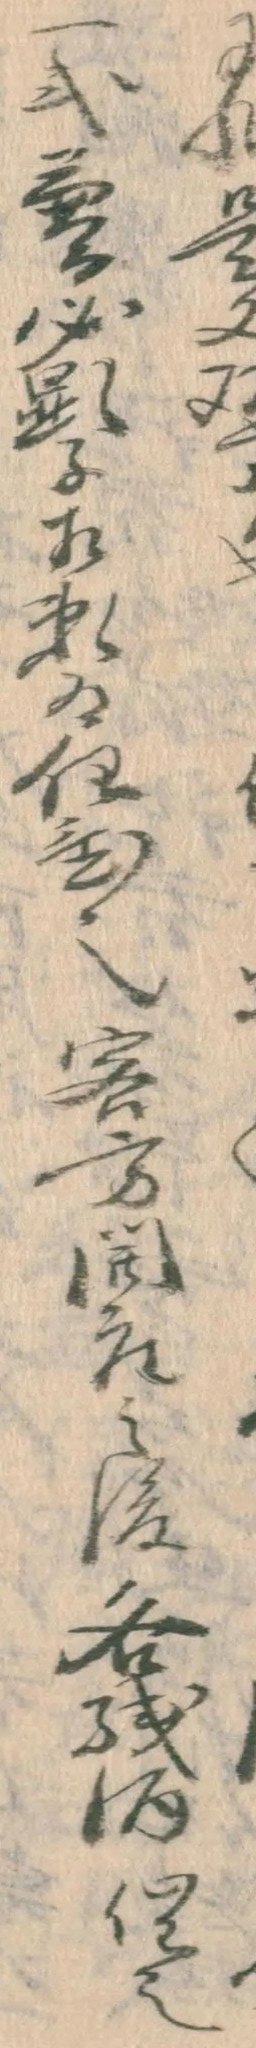一式兼而必顕子相頼為任置也客方開座之後各残酒催之
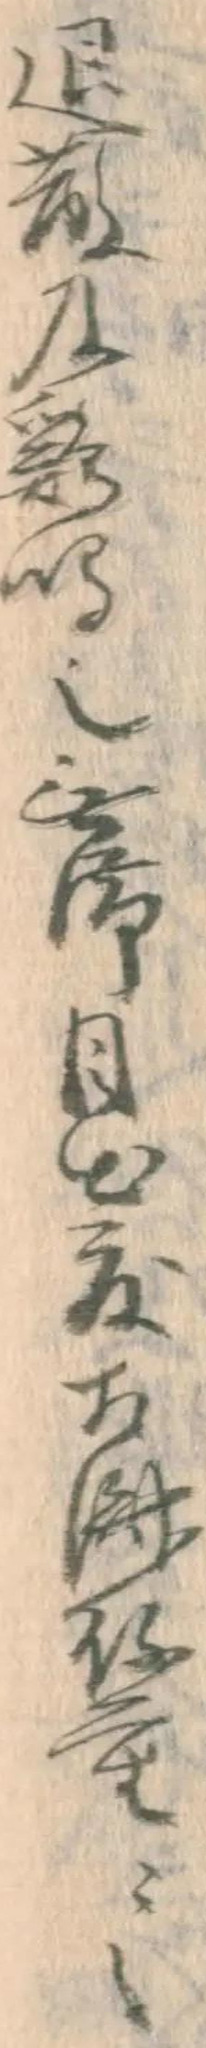退散及鶏鳴也無滞目出度相済致珍重々々
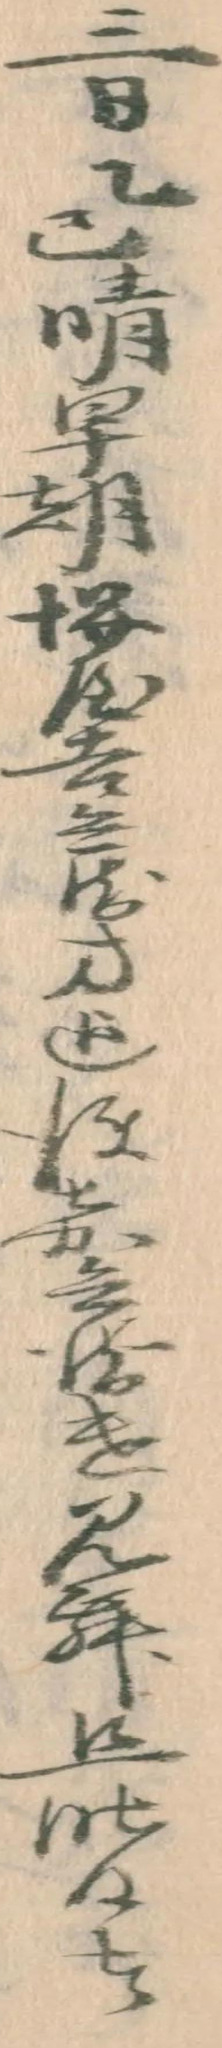三日乙巳晴早朝堺屋吉兵衛方迄弥嘉兵衛遣見舞且昨日は
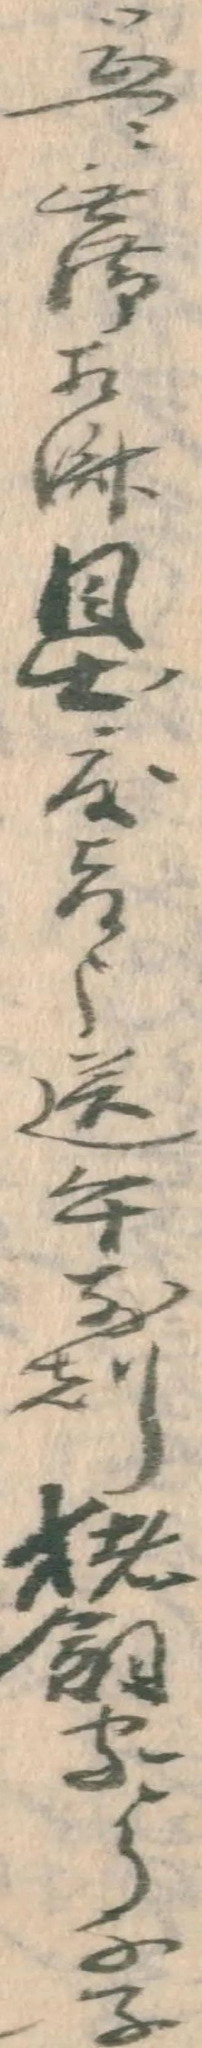御互ニ無滞相済目出度旨申送午前刻猪飼家より千子
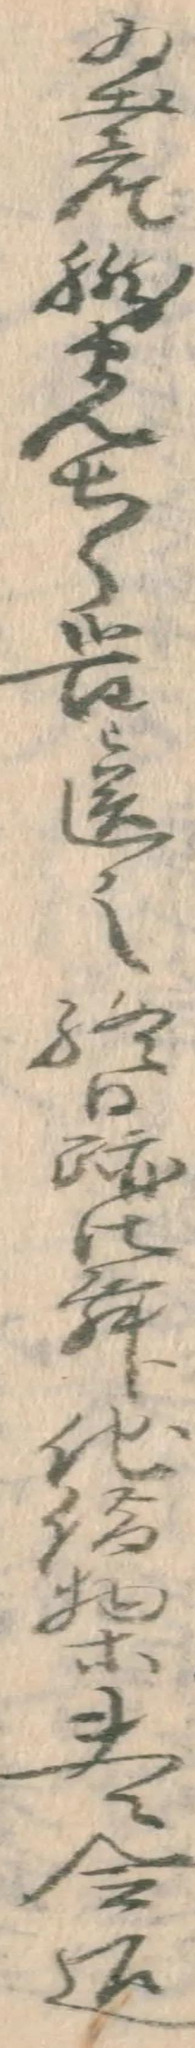為土産まんちう弐百被送也終日跡仕舞他借物等夫々令返
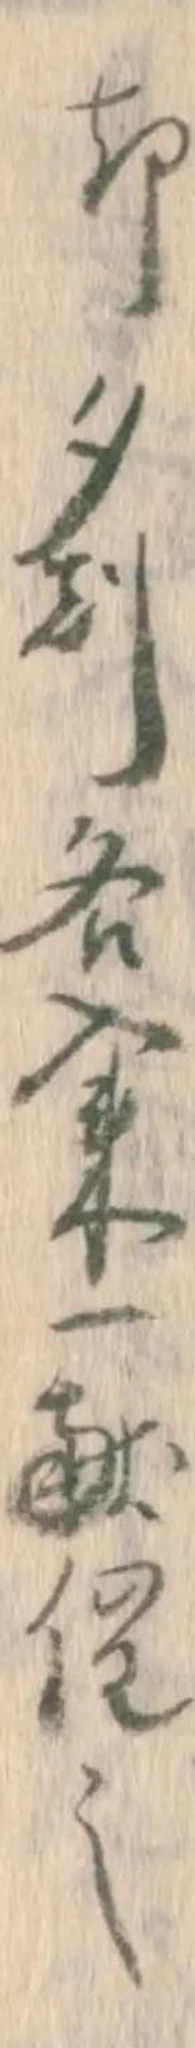却夕刻各入来一献催也
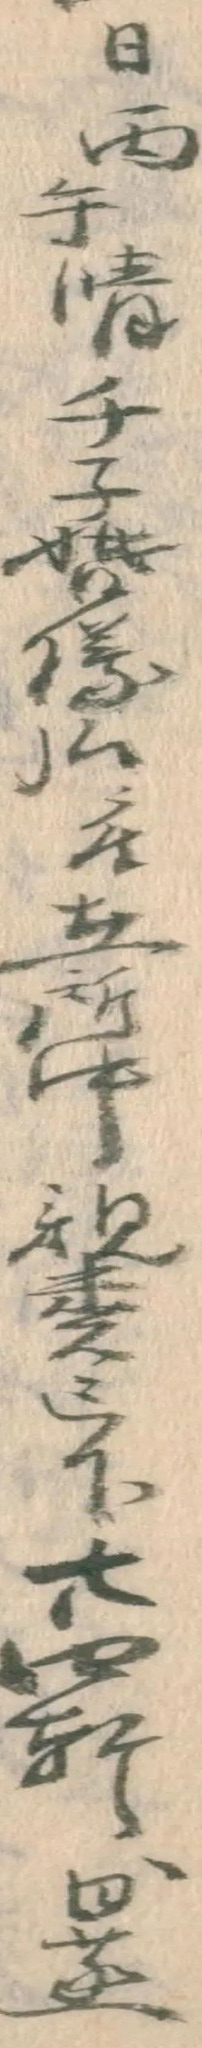四日丙午晴千子婚儀払ニ付在所中親養已下廿四軒へ日蒸
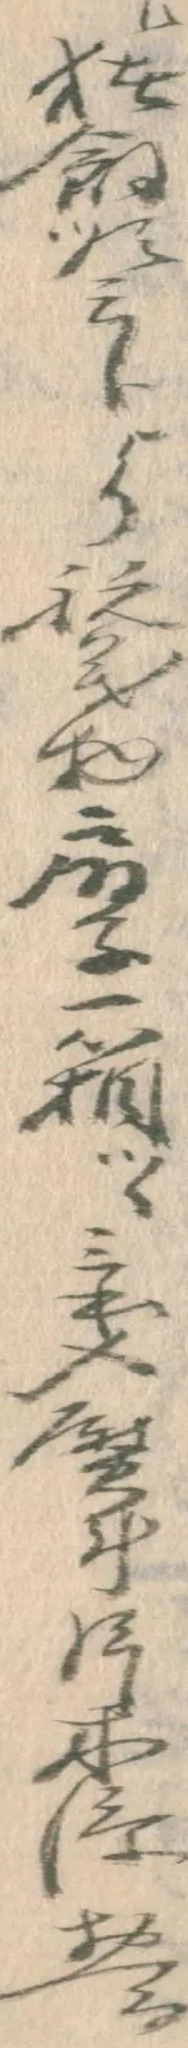え猪飼順三郎より祝義物扇子一箱ツヽ三本入熨斗片木添惣而
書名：賀茂社記録. 第66冊
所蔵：国立国会図書館 National Diet Library, JAPAN
